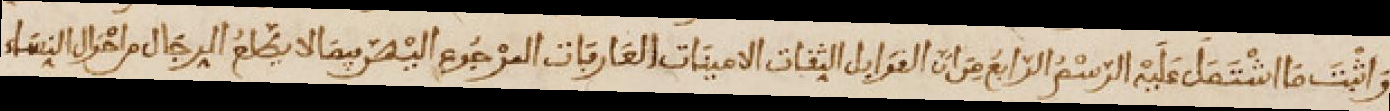واثبت ما اشتمل عليه الرسم الرابع من ان القوابل الثقات الامينات العارفات المرجوع اليهن فيما لا يطلع الرجال من احوال النساء
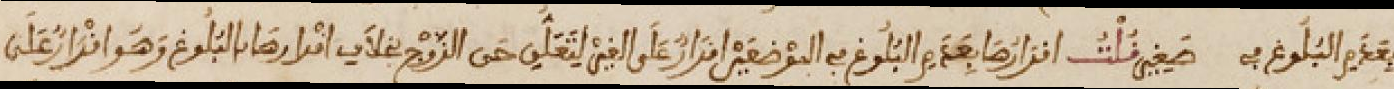بعدم البلوغ في صغير قلت اقرار بعدم البلوغ في الموضعين إقرار على الغير لتعليق حق الزوج به بخلاف إقرارها بالبلوغ وهو إقرار على
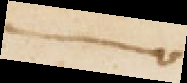قف
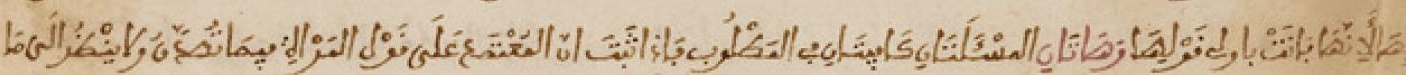بها لانها بانت باولى قولها وهاتان المسئلتان كافيتان في المطلوب فاذا ثبت ان المعتمد على قول المراة فيها تصدق فيه ولا ينظر الى ما
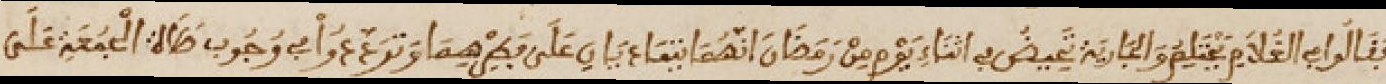فقالوا في الغلام يحتلم والجارية تحيض في اثناء يوم من رمضان أنهما يتماديان على فطرهما وترددوا في وجوب صلاة الجمعة على
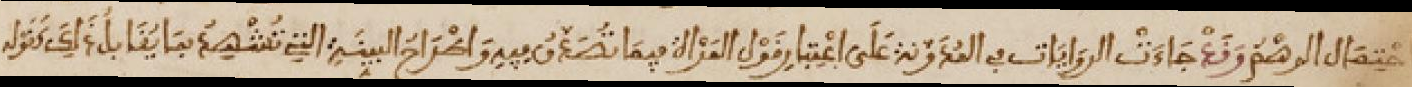احتمال الوهم وقد جاءت الروايات في المدونة على اعتبار قول المراة فيها تصدق فيه واطراح البينة التي تشهد بما يقابل ذلك كقوله
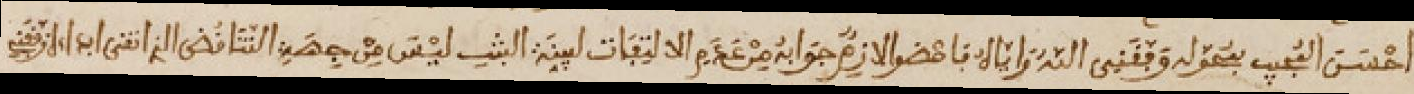احسن المجيب بمحوله وفقني الله واياه فامضوا لازم جوابه من عدم الالتفات لبينة البنت ليس من جهة التناقض الذي اتقن ابداءه وفقني
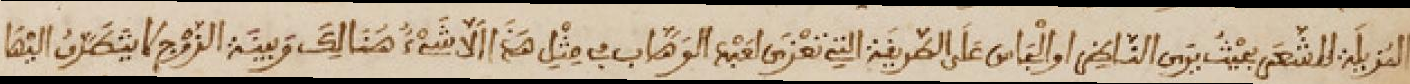المزيلة للشعر بحيث يرى الناظر او الجاس على الطريقة التي تعزى لعبد الوهاب في مثل هذا الاشيء هنالك وبينة الزوج لا يتطرق إليها
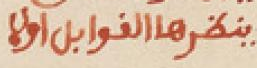ينظرها القوابل او لا
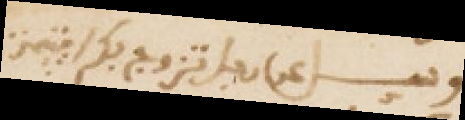وسئل عن رجل تزوج بكرا يتيمة
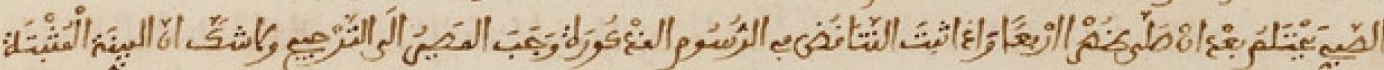الصبي يحتلم بعد ان صلى ظهرا اربعا واذا ثبت التناقض في الرسوم المذكورة وجب المصير الى الترجيح ولا شك ان البينة المثبتة
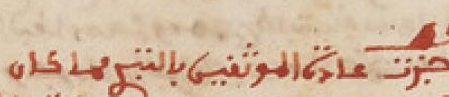جرت عادة الموثقن بالتبري كان
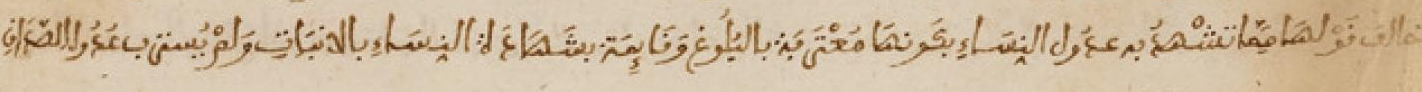خالف قولها مما تشهد به عدول النساء بكونها معترفة بالبلوغ وقائمة بشهادة النساء بالانبات ولم يسترب عدول الصداق
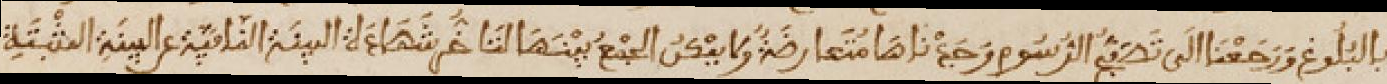بالبلوغ ورجعنا إلى تصفح الرسوم وجدناها متعارضة ولا يمكن الجمع بينها لتأخر شهادة البينة النافية عن البينة المثبتة
